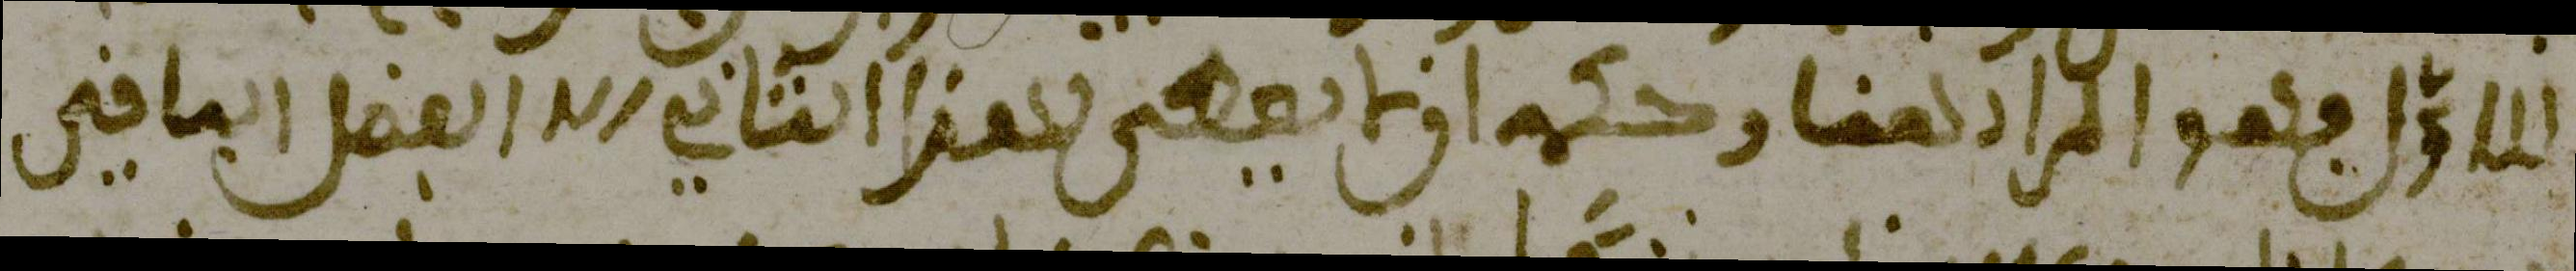للاوَّل فهو المراد هنا وحكمه ان لا يعطى لهاذا الثاني الا الفضل الباقي
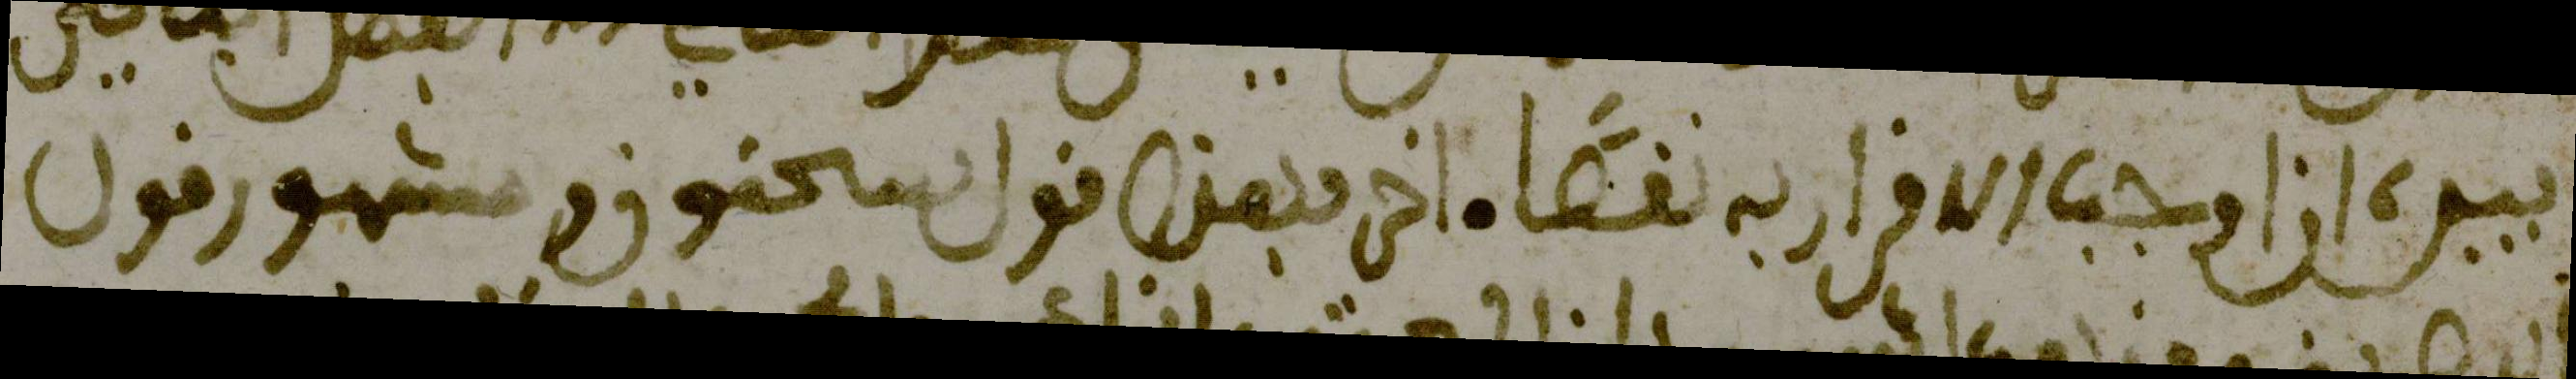بيده ان اوجب الاقرار به تقصًا ءاخر فهذا قول سحنون ومشهور قول
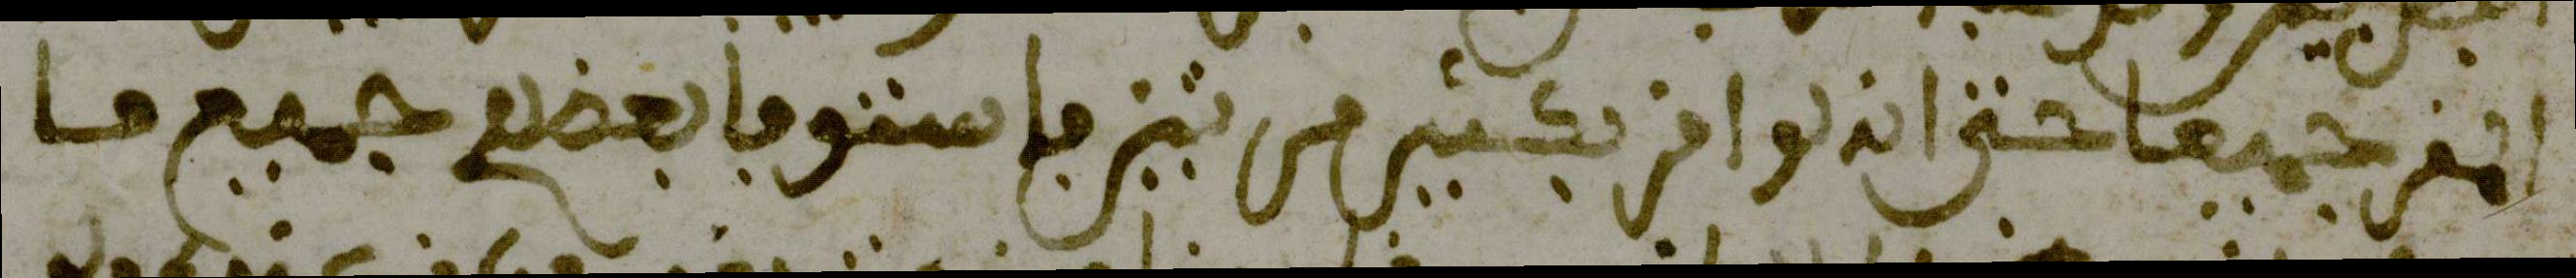المقر جميعا حتى انه لو اقر بكثير من تبين فاستوفا بعضهم جميع ما
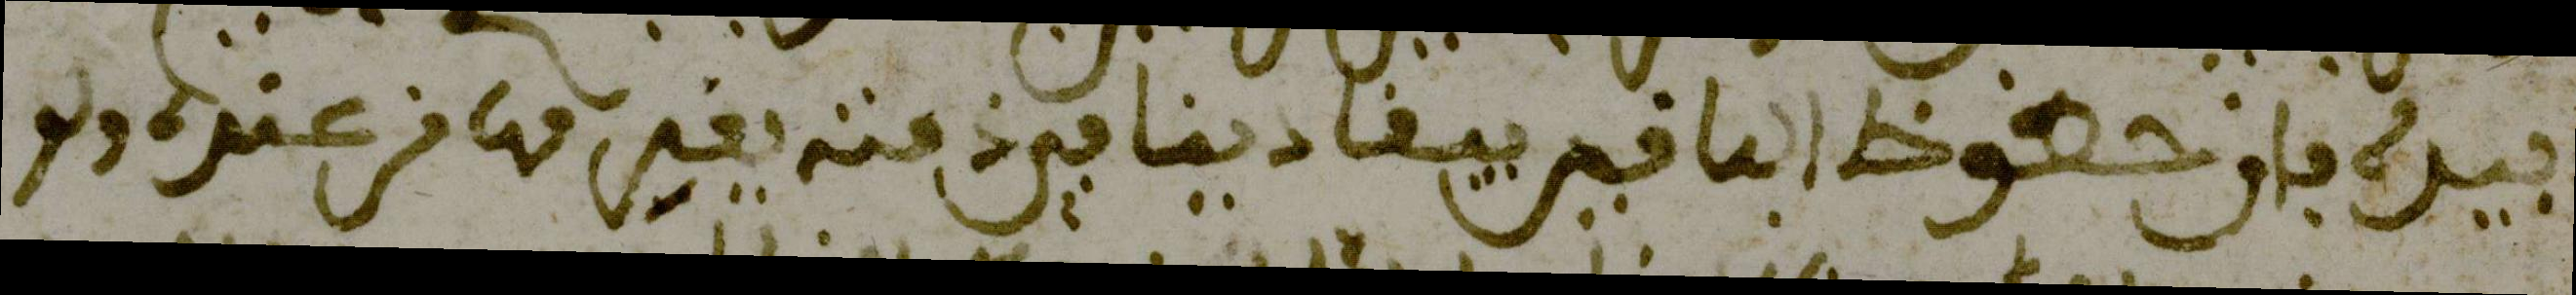بيده فان حضوظ الباقين تبقا ددينا في ذمته يغرمها من عنده ولو
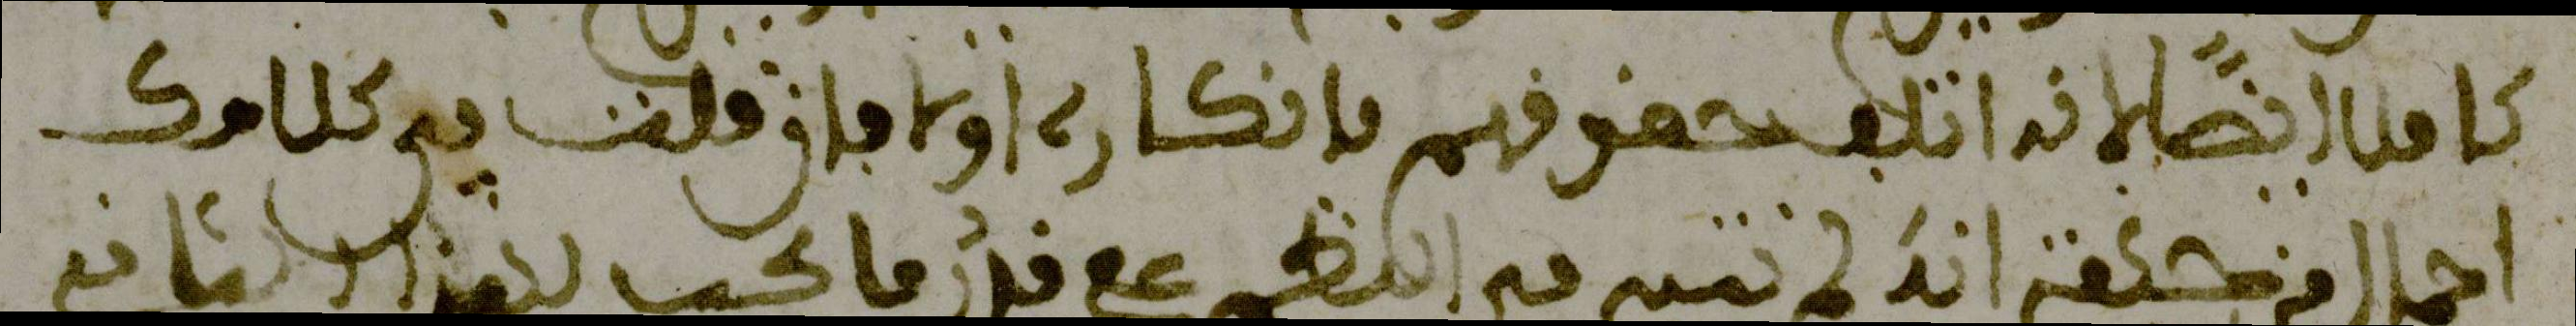كاملا ايضًا لانه اتلف حقوقهم بانكاره اولا فان قلت في كلامك
